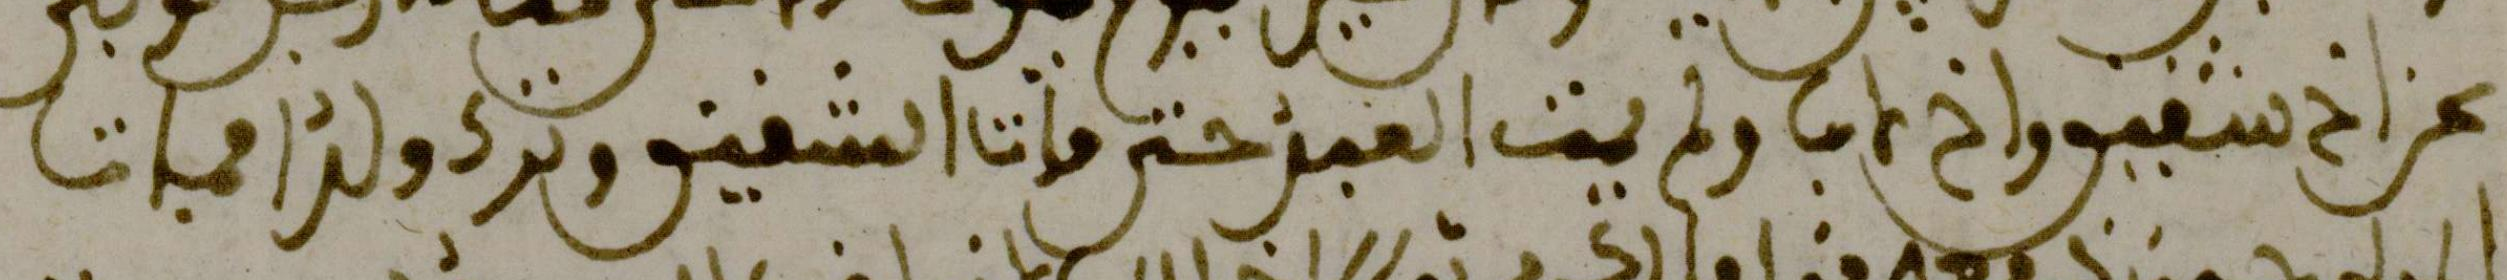عن اخ شقيق واخ لاب ولم يمت العبد حتى مات الشقيق وترك ولدا فمات
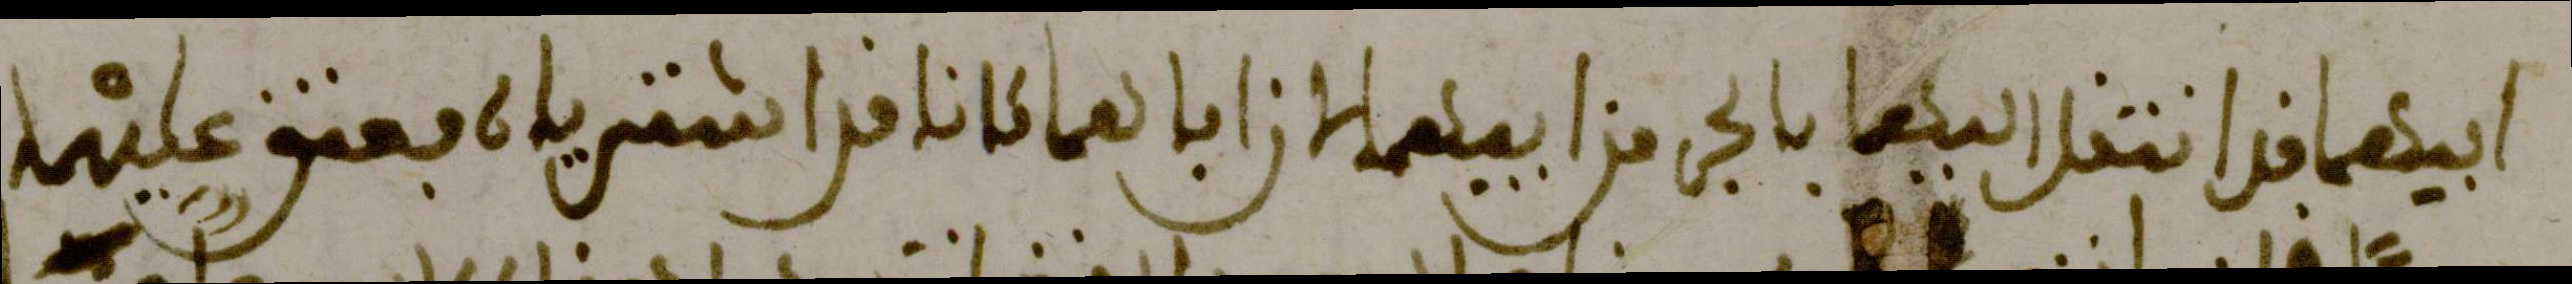ابيهما قد انتقل اليهما بالجر من ابيهما لان باهما كانا قد اشترياه فعتق عليهما
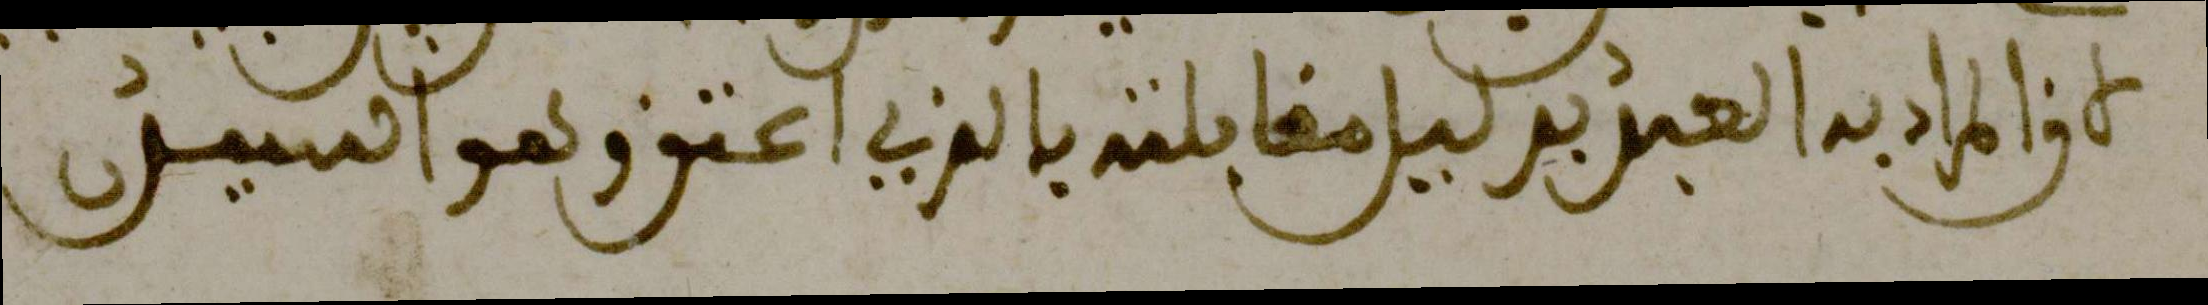لان المراد به العبد بد ليل مقابلته بالذي اعتق وهو السيد
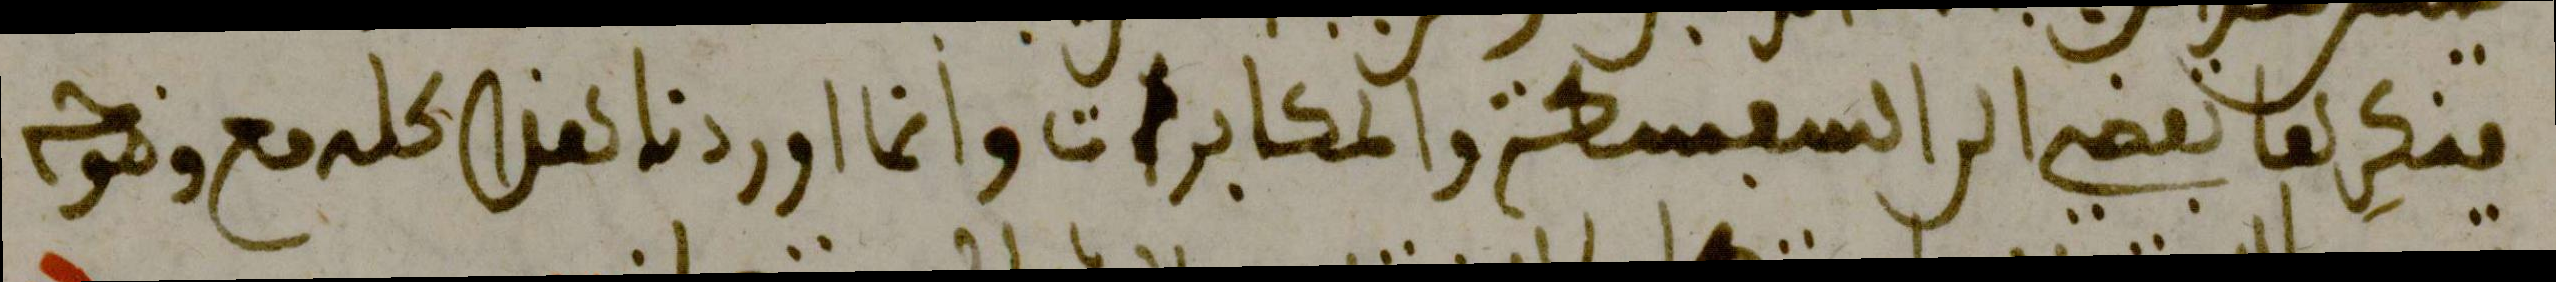منكرها تفضي الى السفسطة والمكابرات وانما اوردنا هذا كله مع وضوحه
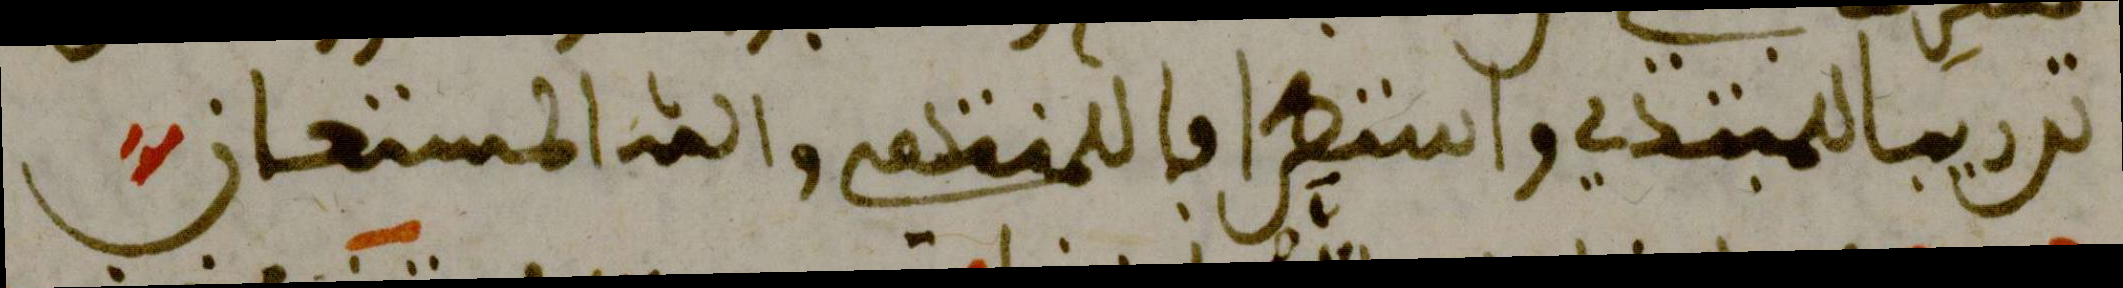تدريبا للمبتدي واستطر افا للمنتهي والله المستعان
